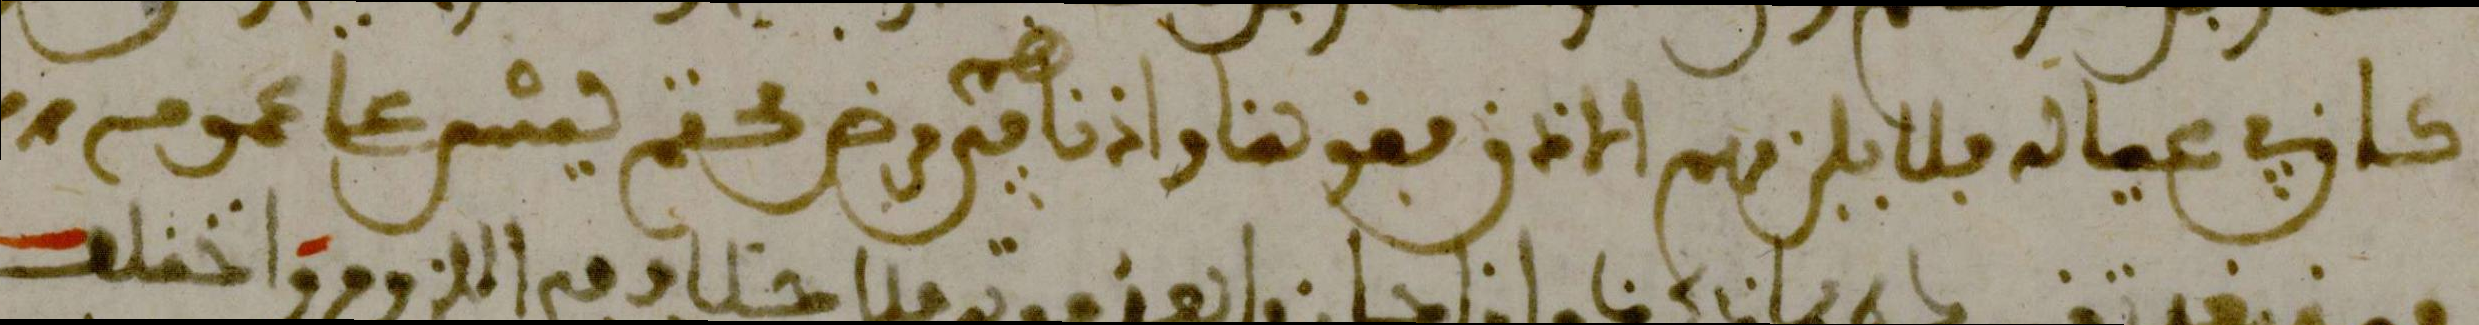كان في عياله فلا يلزمهم الاذن فقولنا واذنا في مرض محتم ليس على عمومه
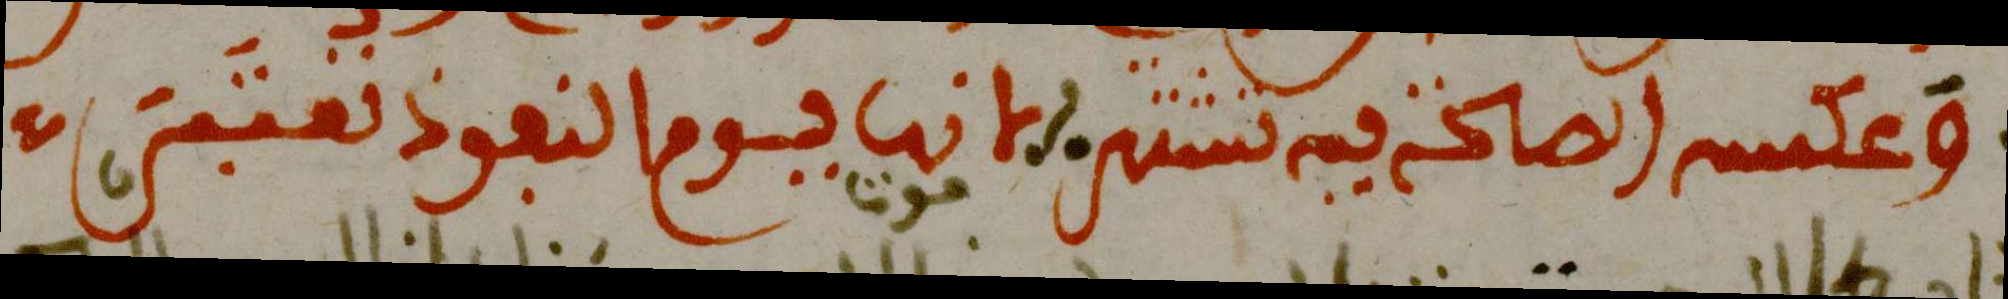وعكسه الصحة فيه تشتهر لانها يوم لنفوذ تعتبر
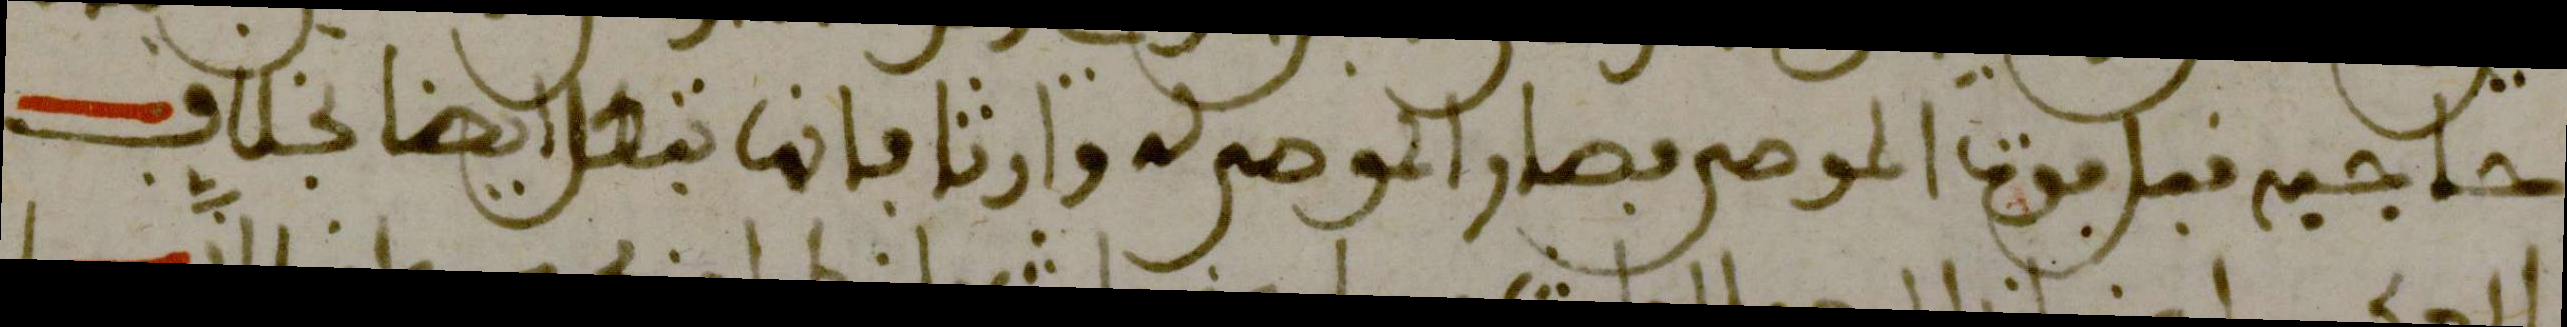حاجبه قبل موت الموصى فصار الموصى له وارثا فانها تبطل أيضا بخلاف
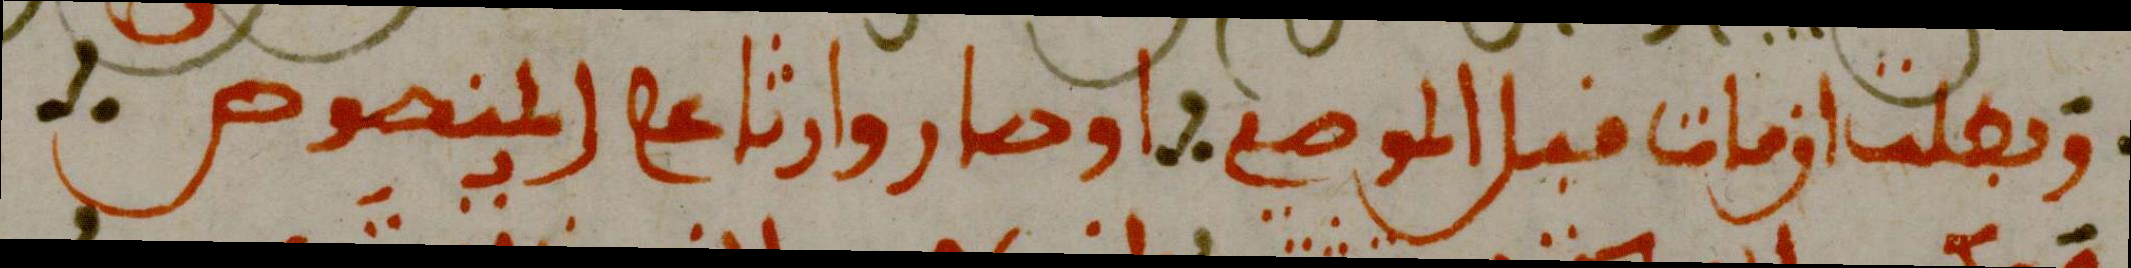وبطلت ان مات قبل الموصي او صار وارثا على المنصوص
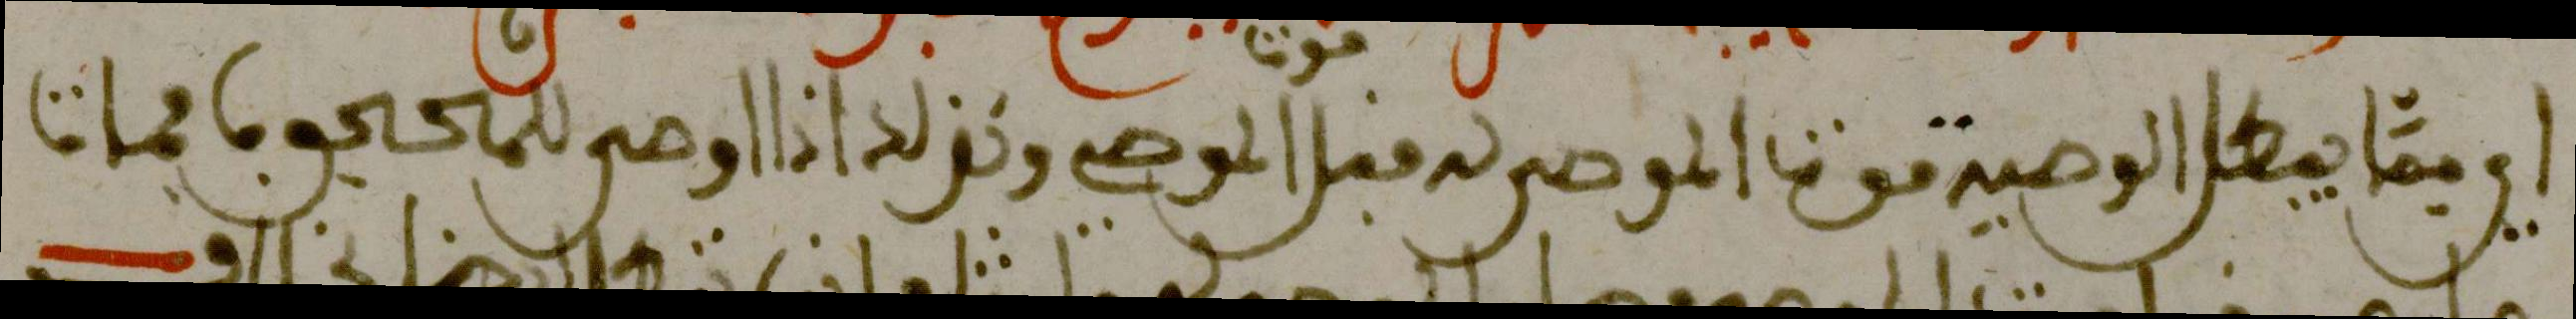اي ممّا يبطل الوصية موت الموصى له قبل الموصي وكذلك اذا اوصى المحجوب فمات
